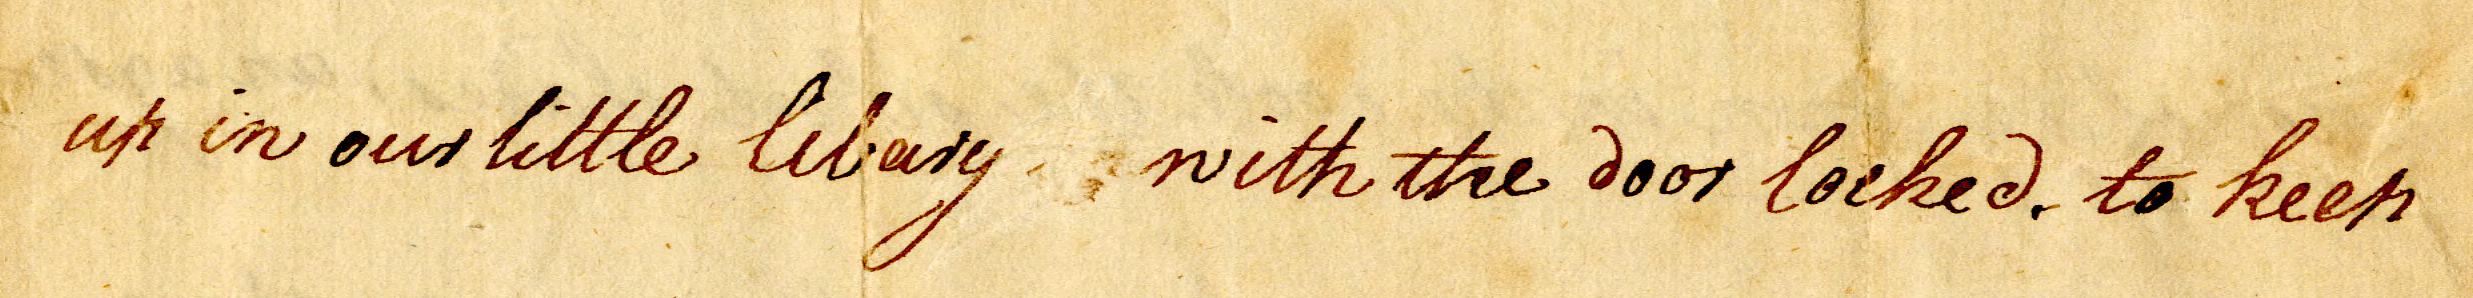up in our little libary with the door locked to keep
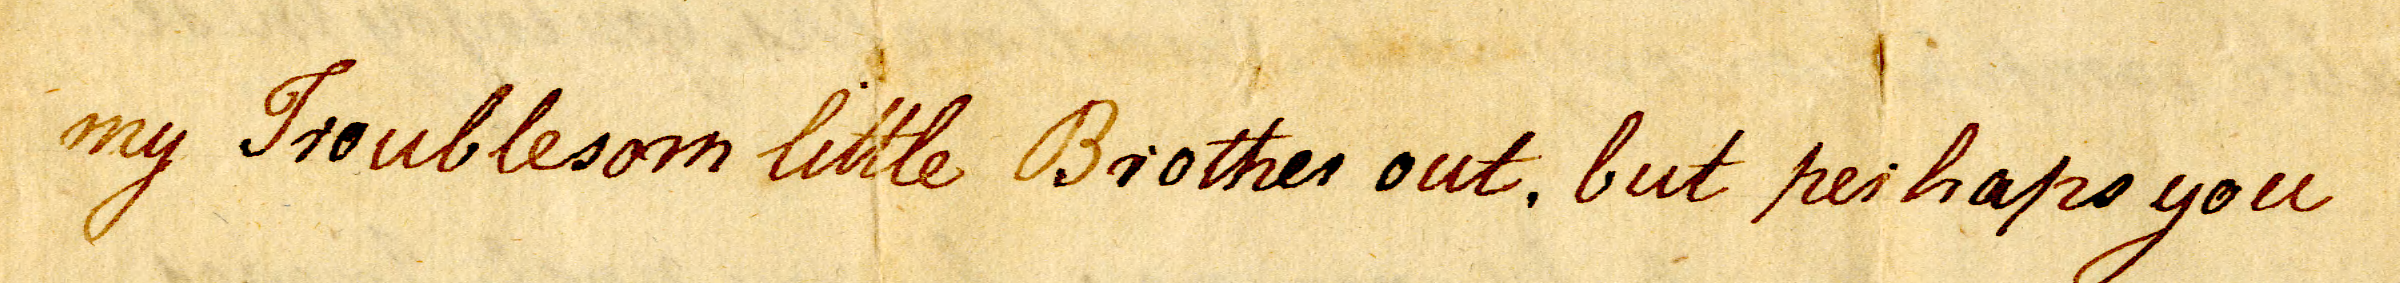my Troublesom little Brother out, but perhaps you
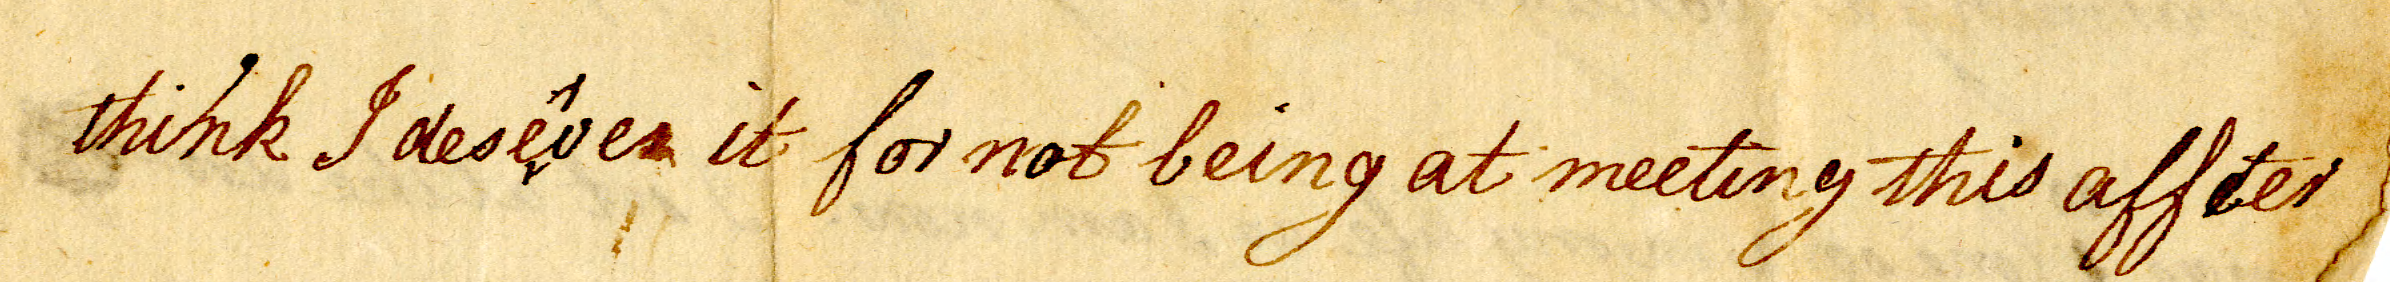think I dese^rve it for not being at meeting this after
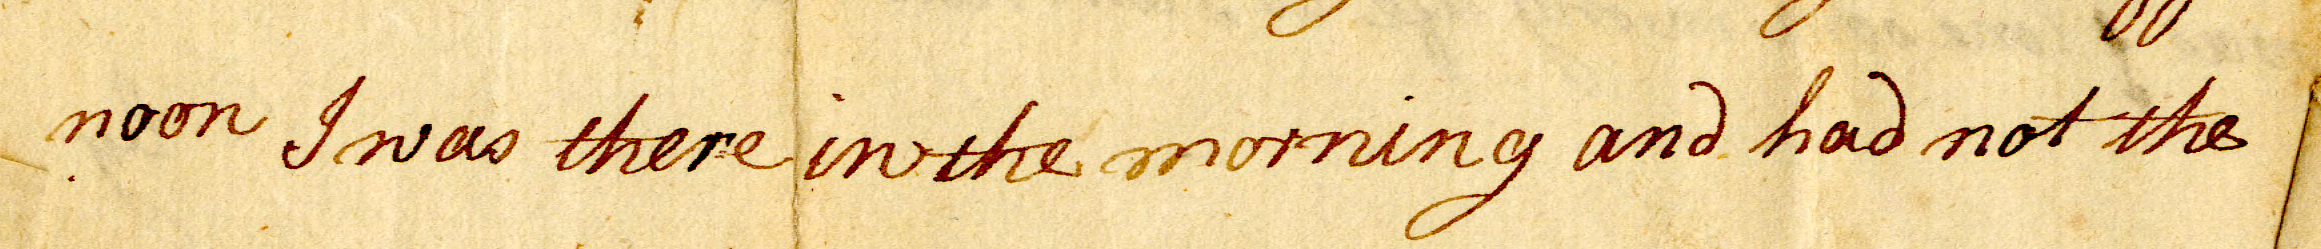noon I was there in the morning and had not the
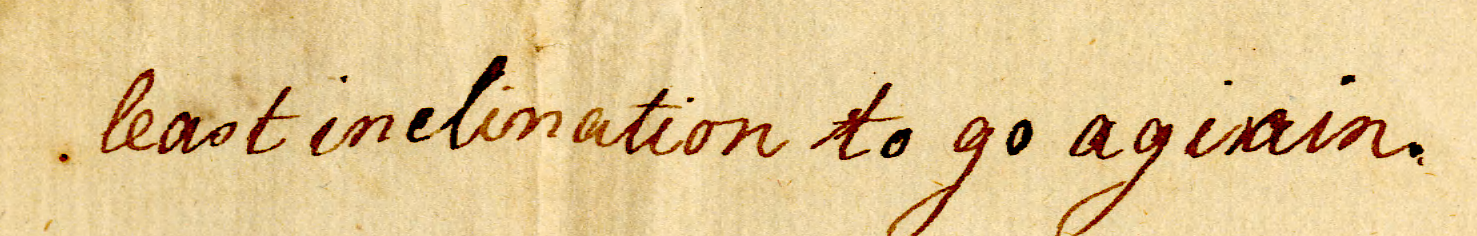least inclination to go agiain.
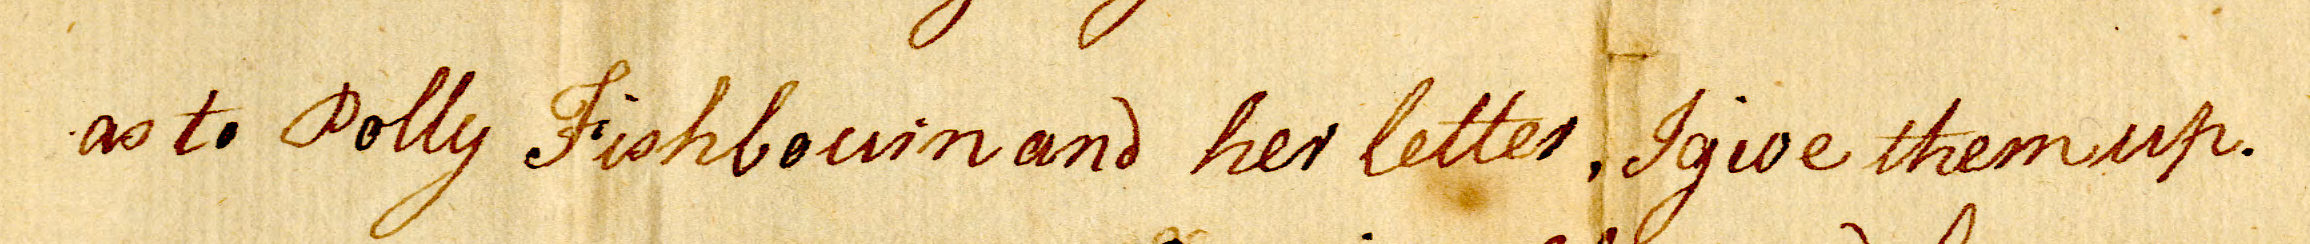as to Polly Fishbouin and her letter, I give them up.
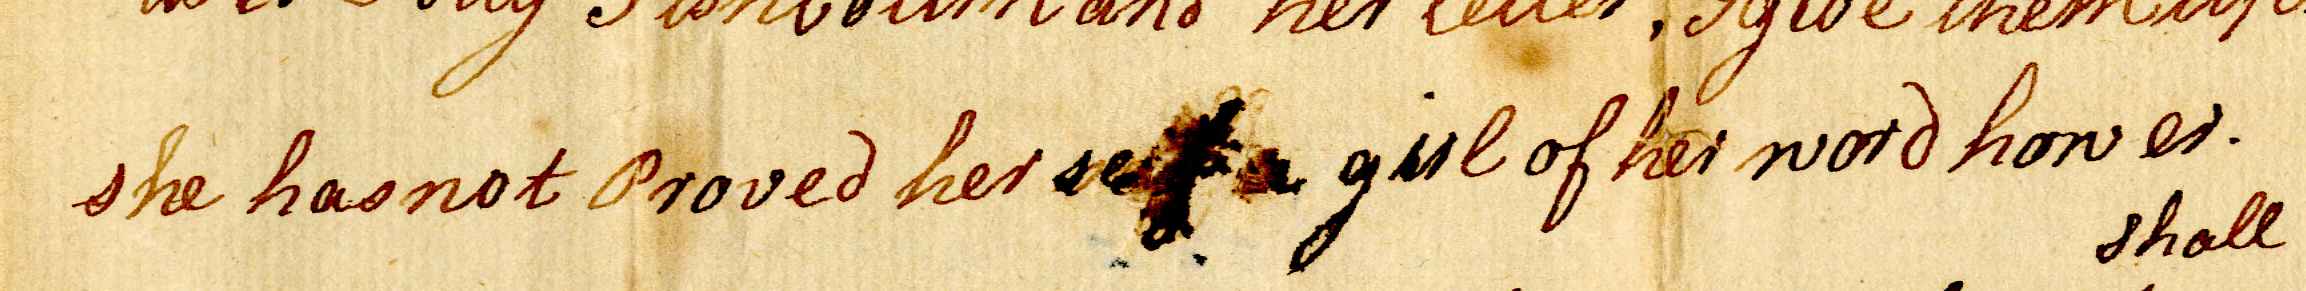she has not Proved her self a girl of her word hower.
